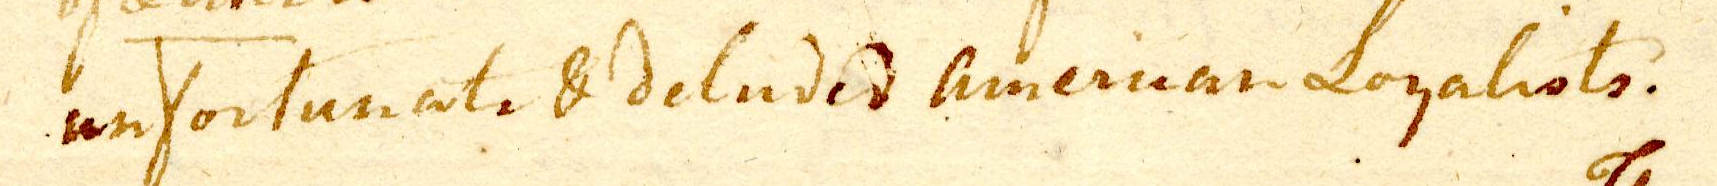unfortunate & deluded American Loyalists.
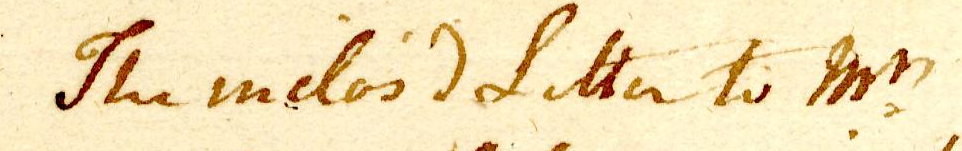The inclos'd Letter to M^r.
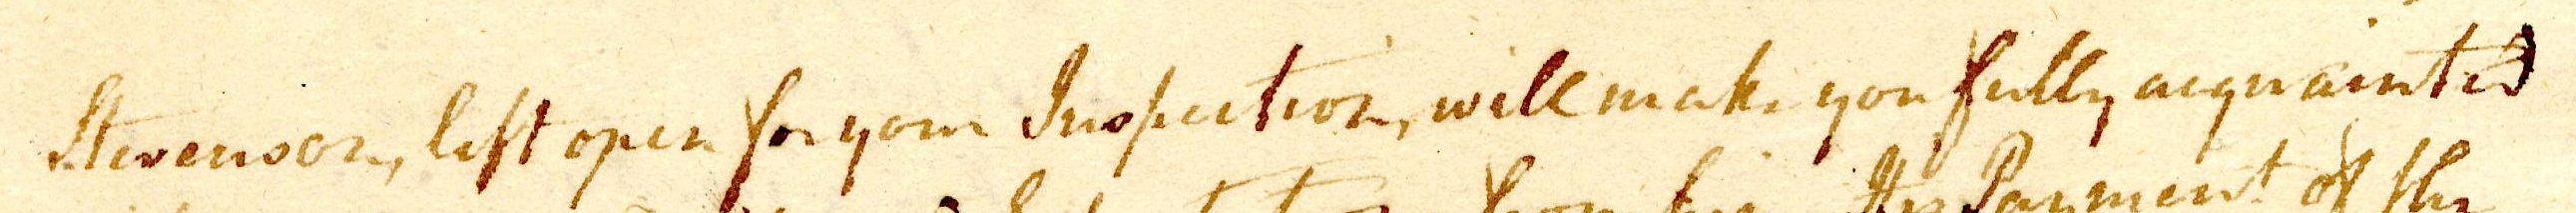Stevenson, left open for your Inspection, will make you fully acquainted
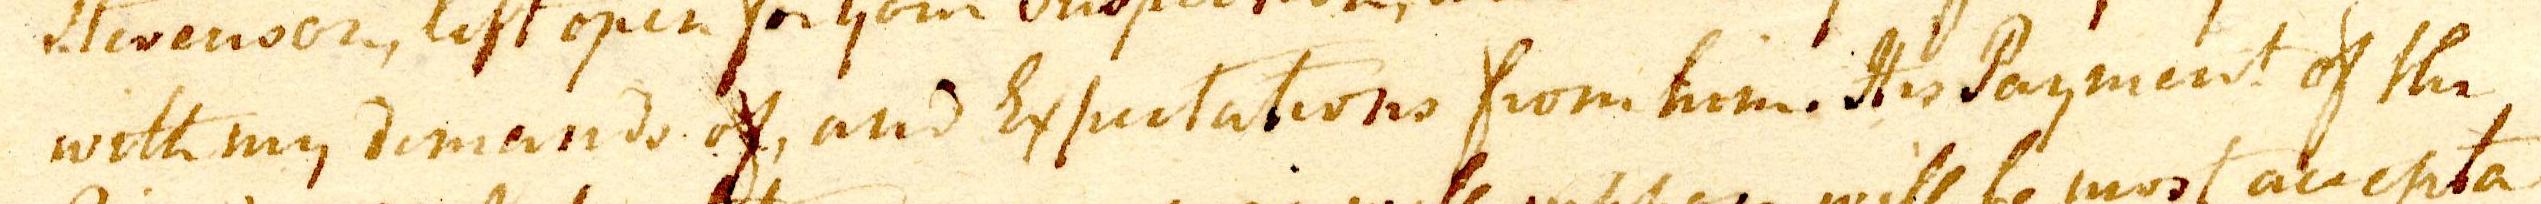with my demands of, and Expectations from him. His Payment of the
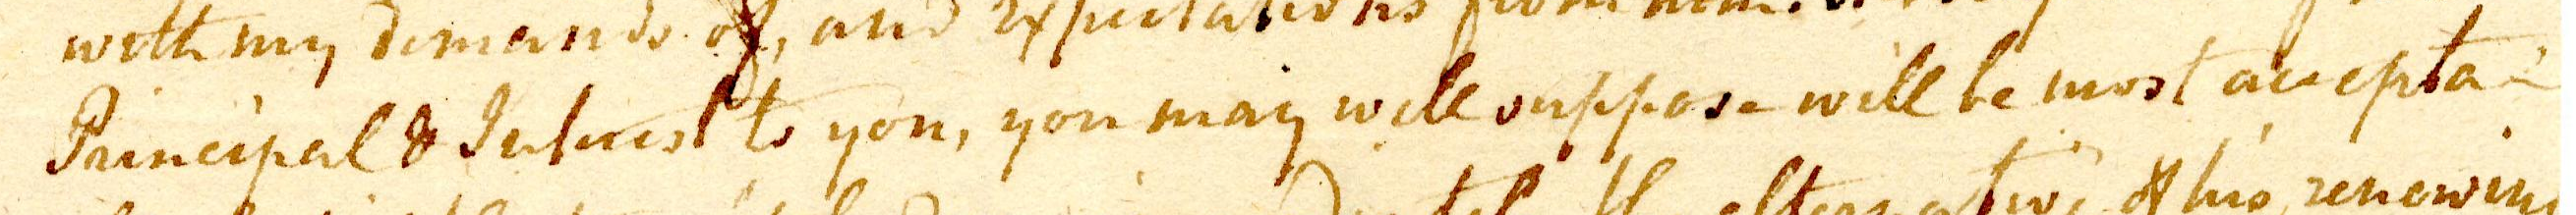Principal & Interest to you, you may well suppose will be most accepta-
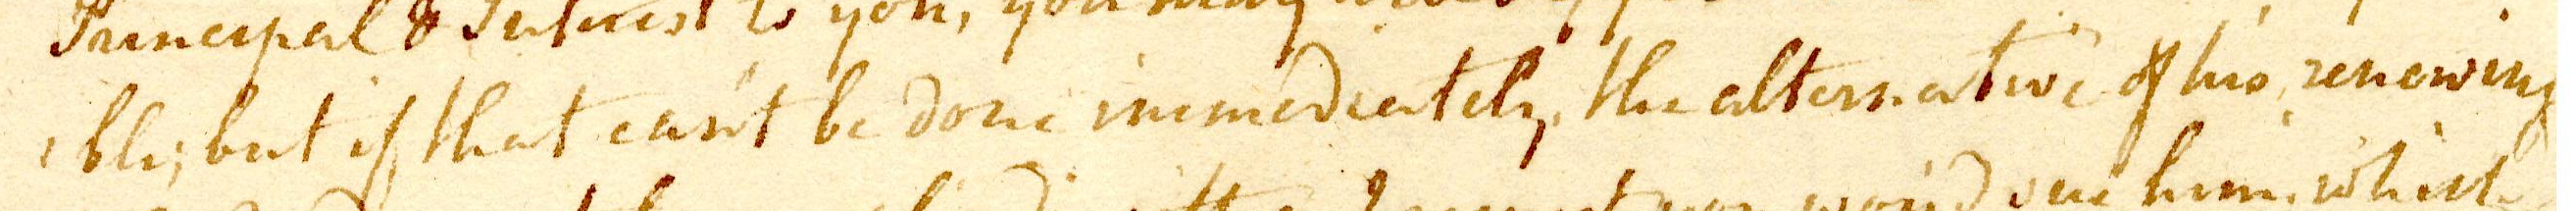-ble, but if that cant be done immediately the alternative & his renowing
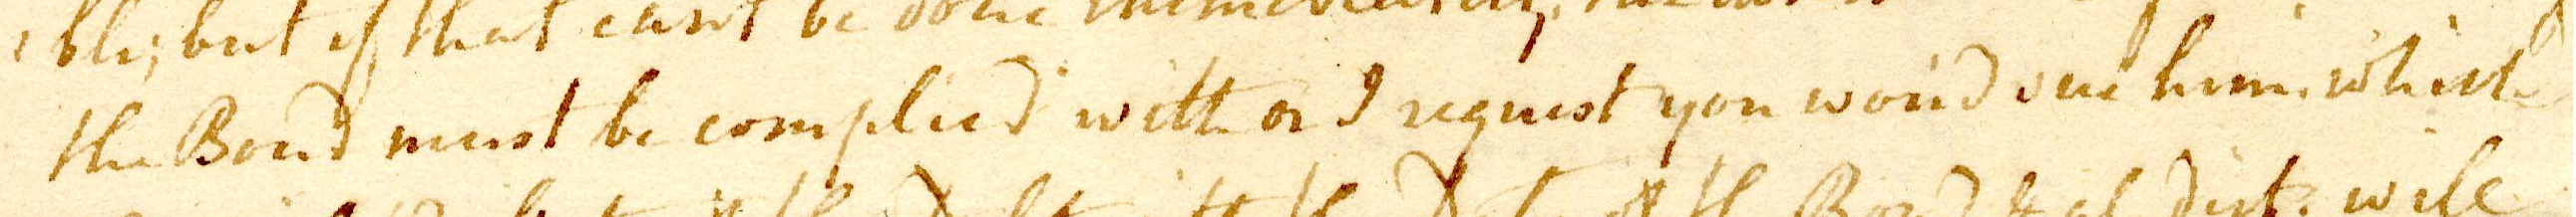the Bond must be complied with or I request you wou'd sue him which
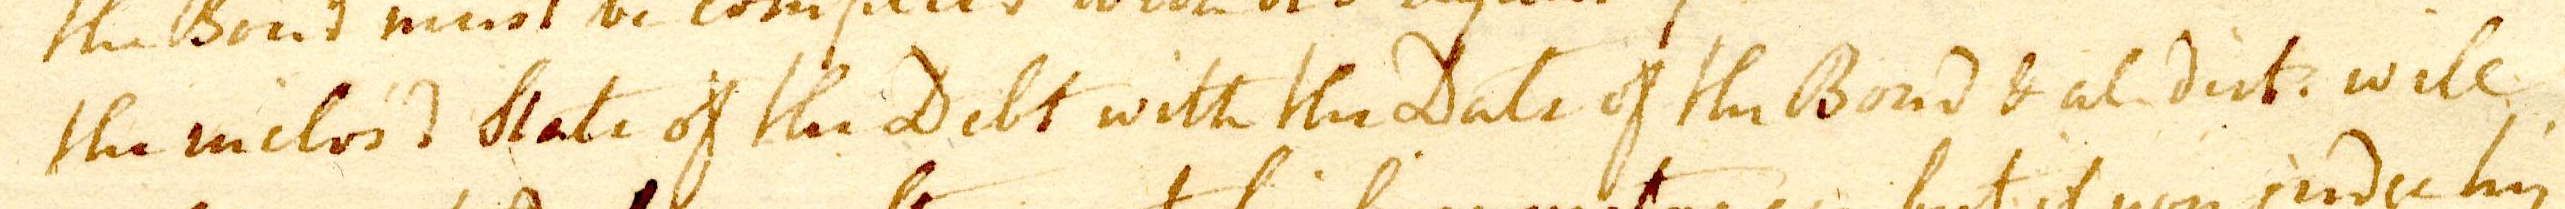the inclos'd State of the Debt with the Date of the Bond & al dist. will
